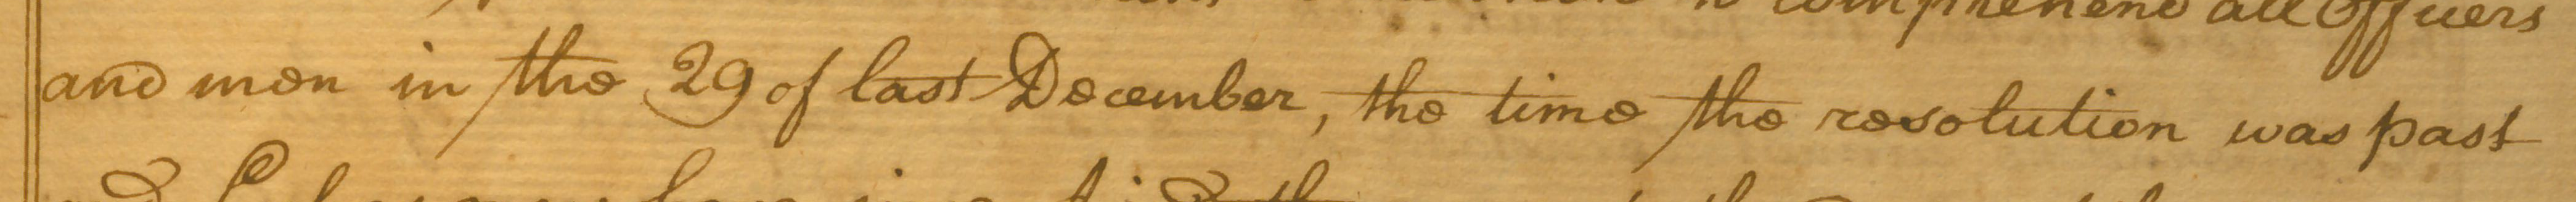and men in the 29 of last December, the time the resolution was past
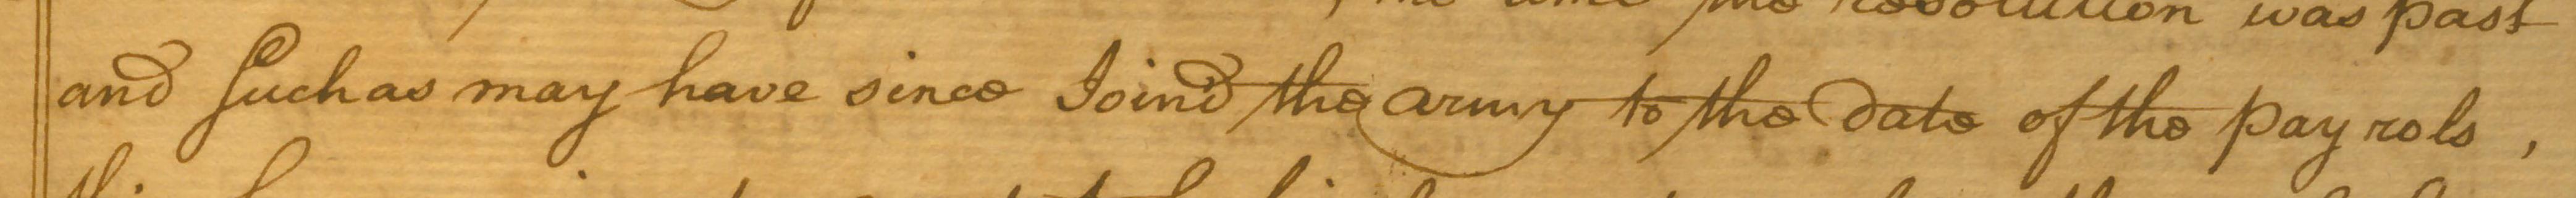and such as may have since Join'd the army to the date of the pay rols,
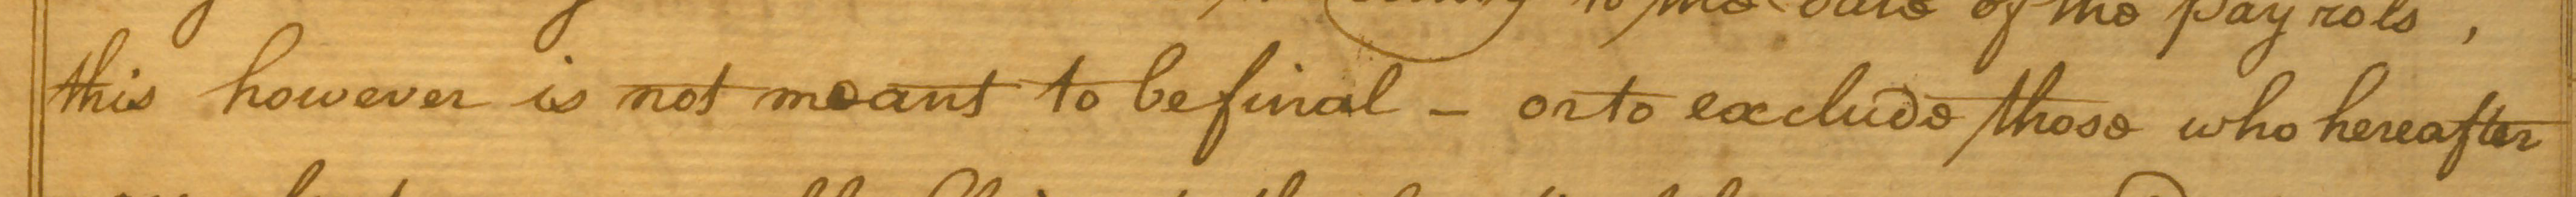this however is not meant to be final- or to exclude those who hereafter
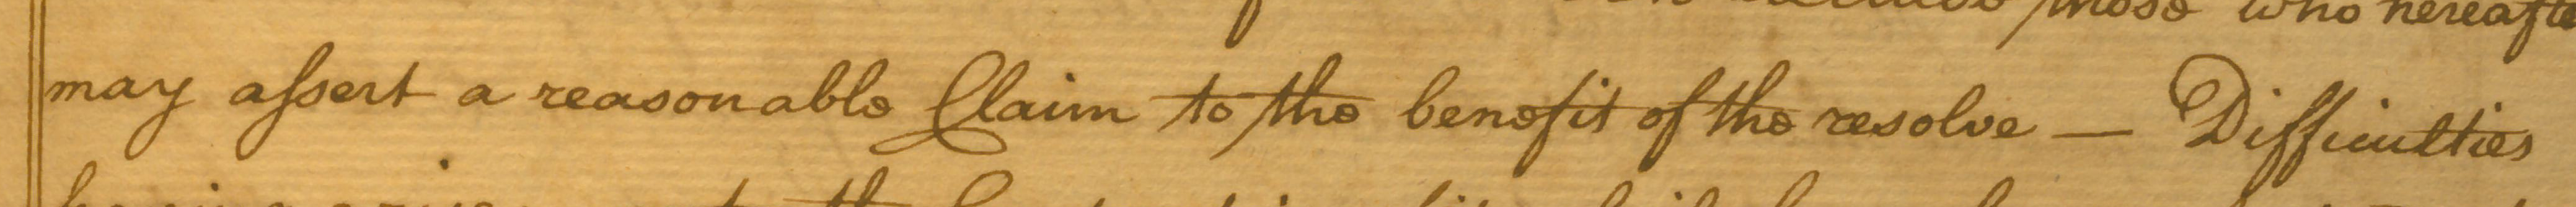may assert a reasonable Claim to the benefit of the resolve- Difficulties
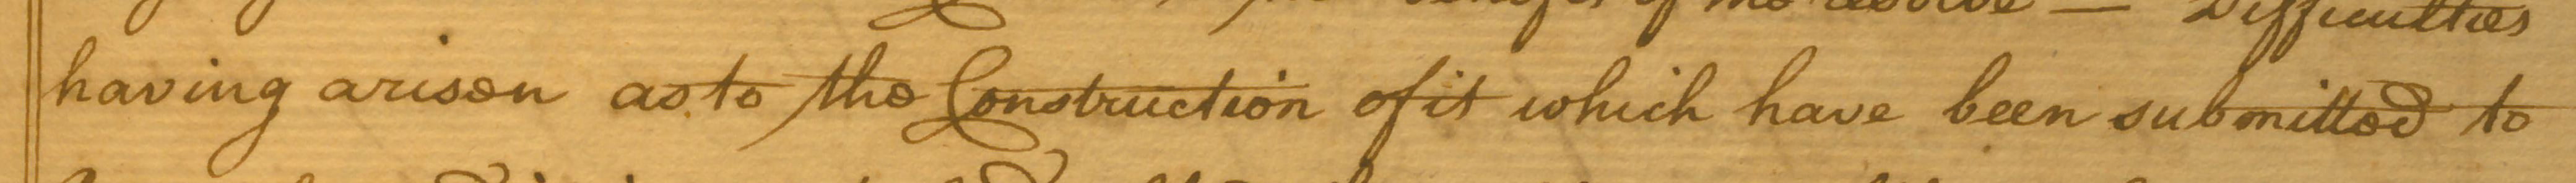having arisen as to the Construction of it which have bene submitted to
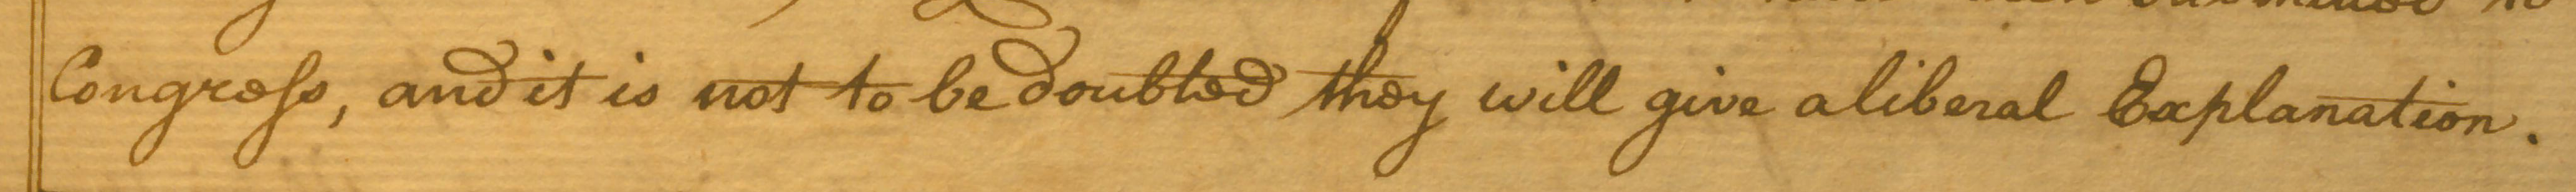Congress, and it is not to be doubted they will give a liberal Explanation.
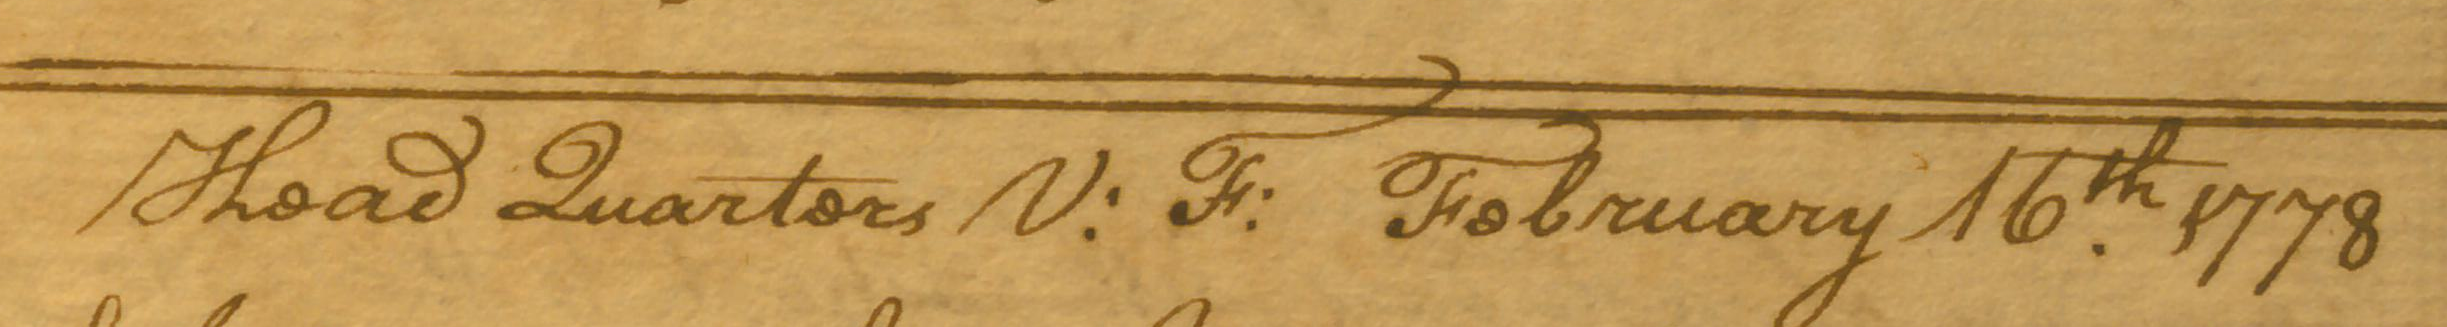Head Quarters V: F: February 16^th. 1778
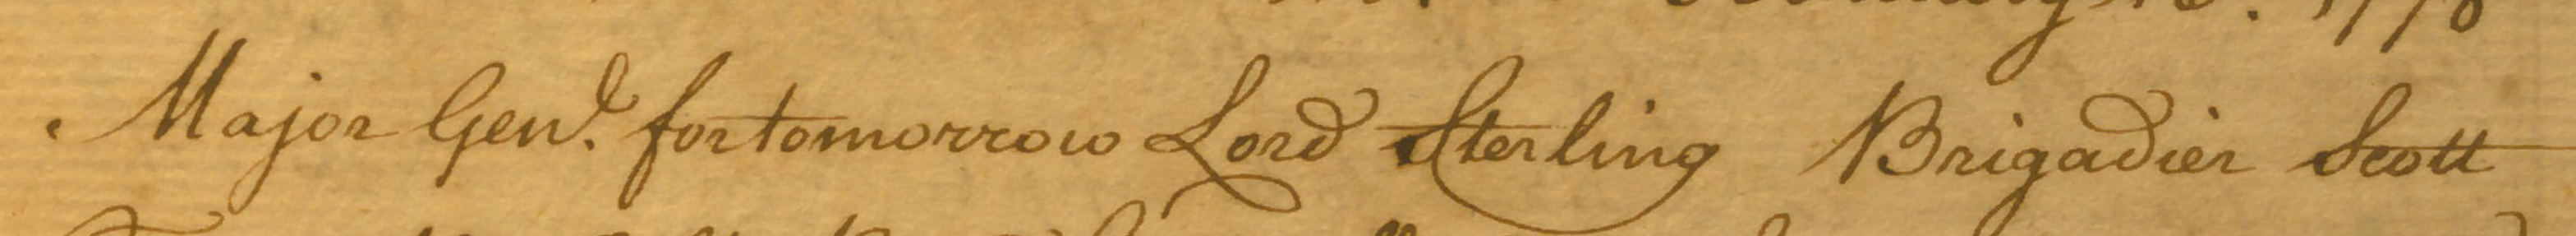Major Gen^l. for tomorrow Lord Sterling Brigadier Scott
